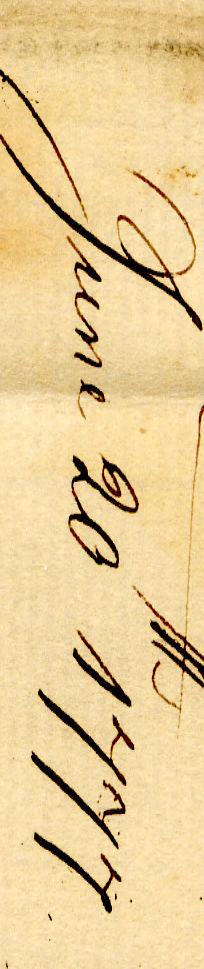June 20^th 1777
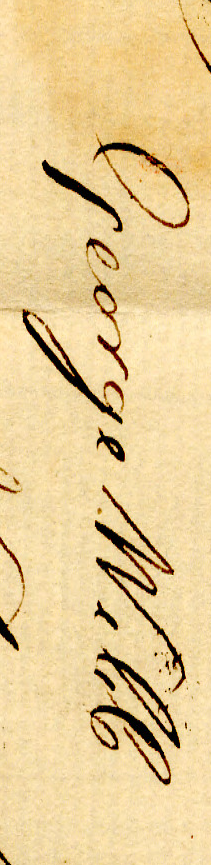George Webb
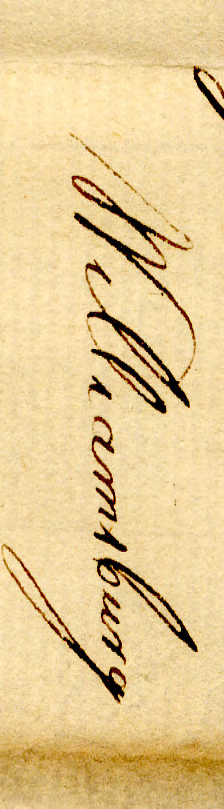Williamsburg
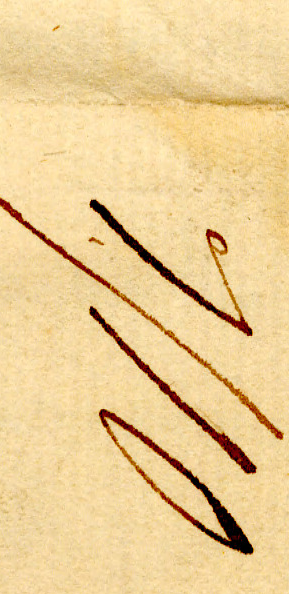7/10
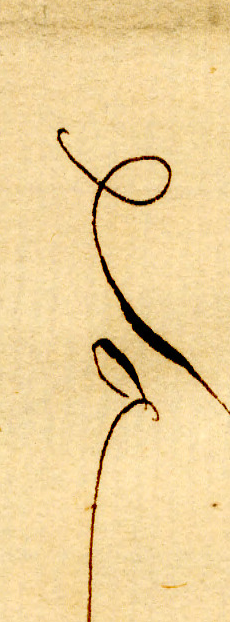To
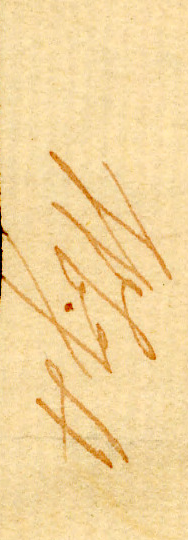WbgH
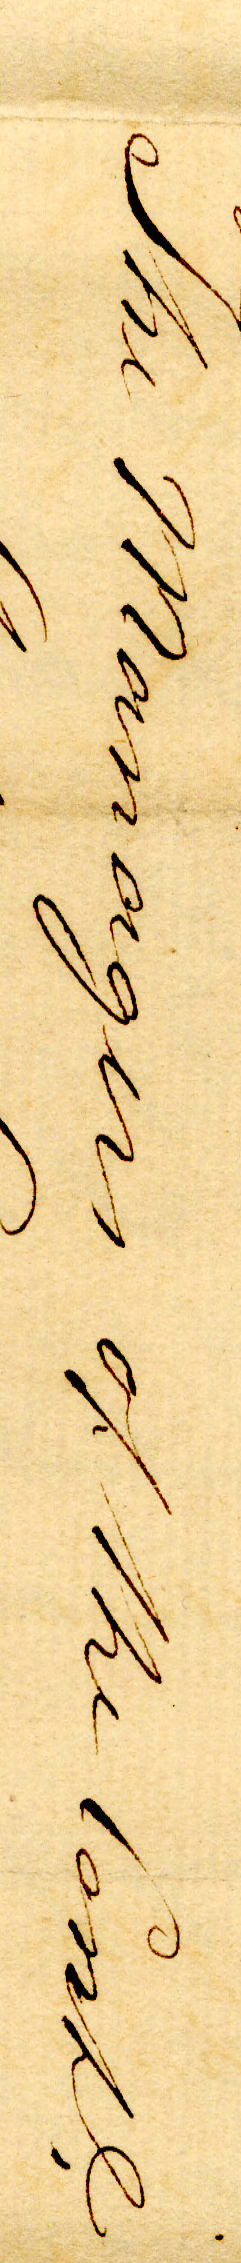The Managers of the Cont.^l
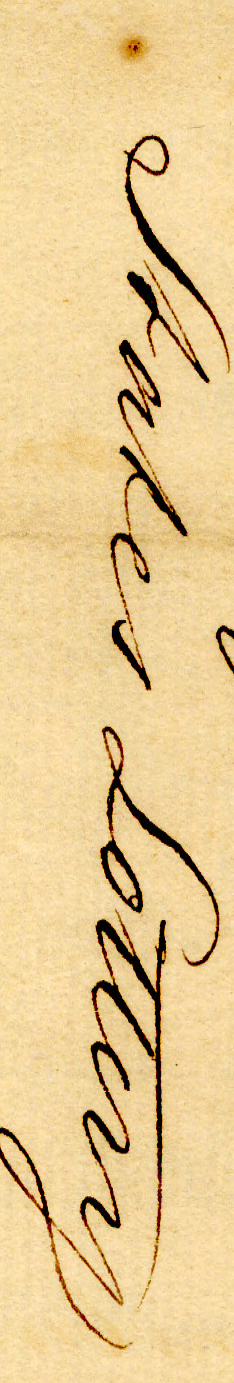States Lottery
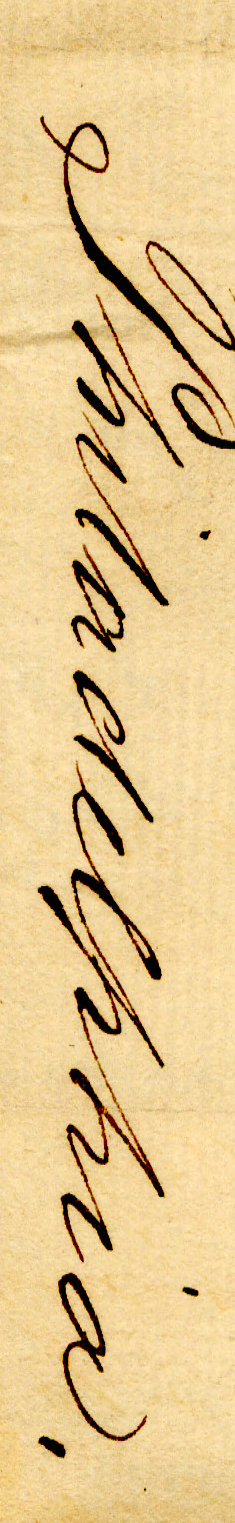Philadelphia.
